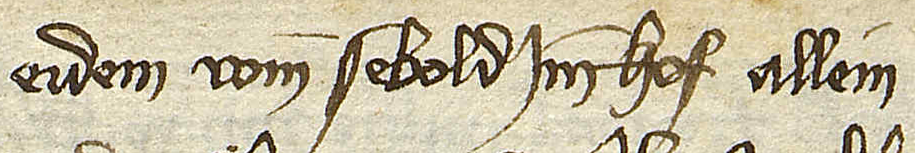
eidem vom* ſebold Im* Hof allein
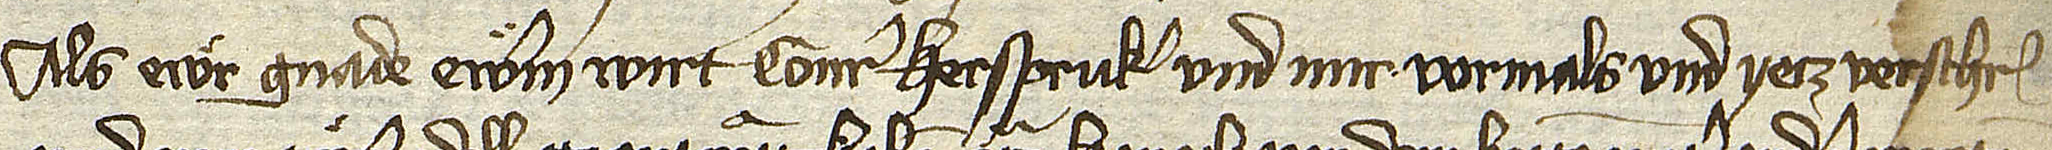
Als ewr gnade ew*n wirt Conr* Herſpruk* vnd mir . vormals vnd yecʒ verſchr*
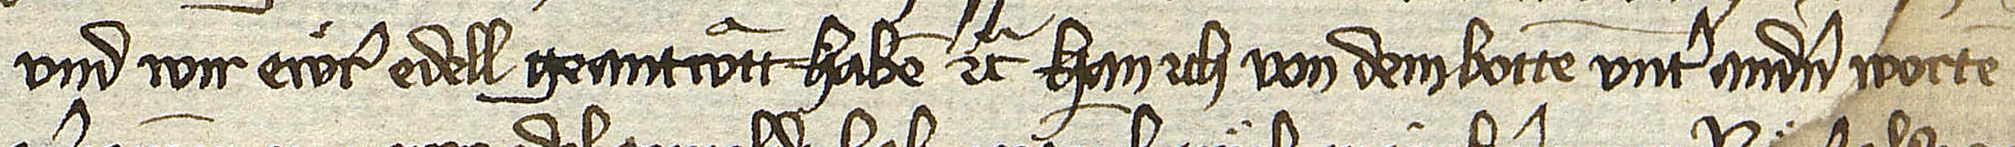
vnd wir ew*r edell geantw*tt habe* ec* Han ich von dem botte* vnt* and*n worte*
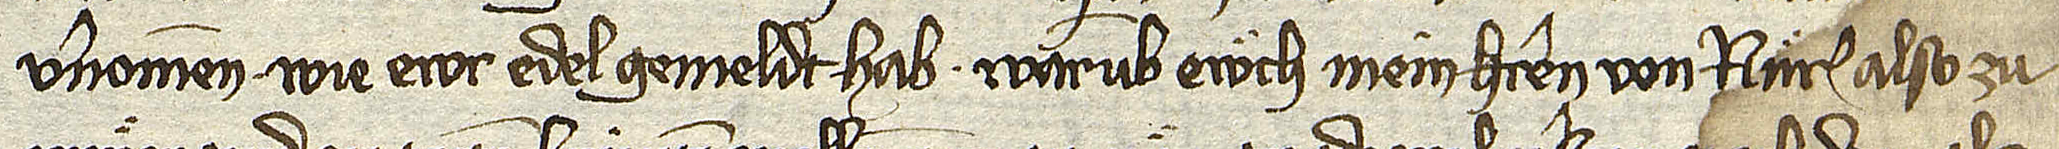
v*nomen* wie ewr edel gemeldt hab . waru*b ewch mein h*ren von Nür* alſo ʒu
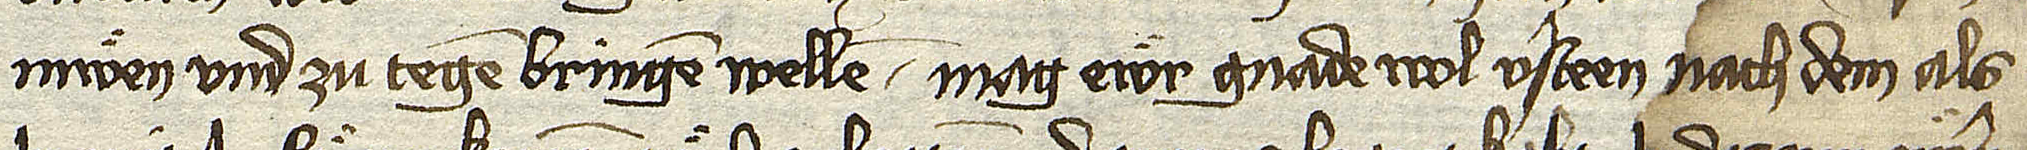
mwen vnd ʒu tege* bringe* welle* / mag ewr gnade wol v*ſteen nach dem als
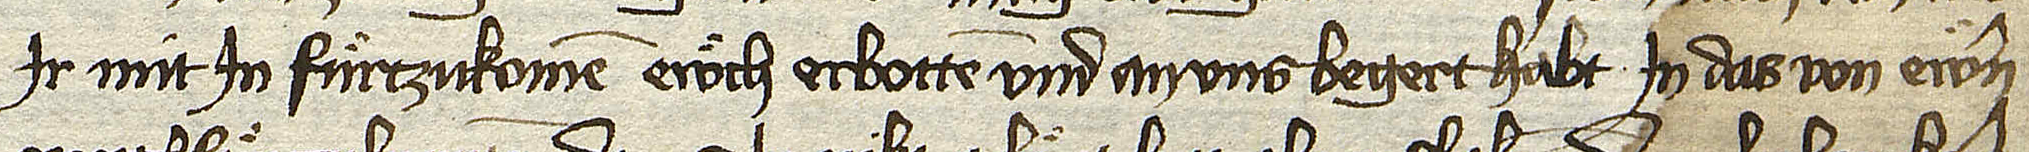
Ir mit In fürcʒukome* ewch erbotte* vnd an vns begert habt . In das von ew*n
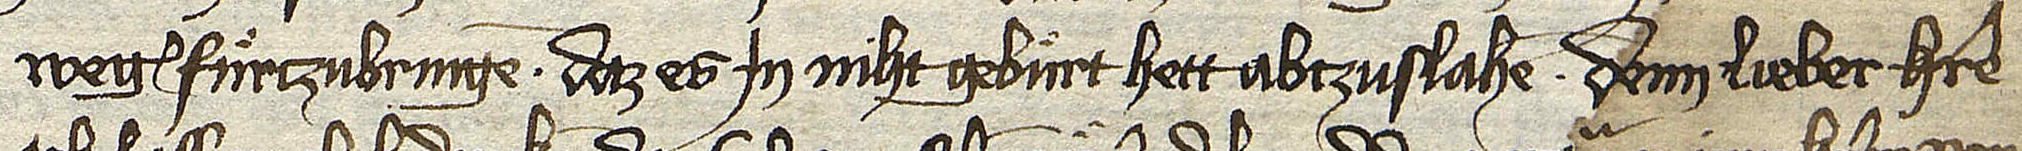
weg* fürcʒubringe* . daʒ es In niht gebürt hett abcʒuſlahe* . Denn lieber h*re
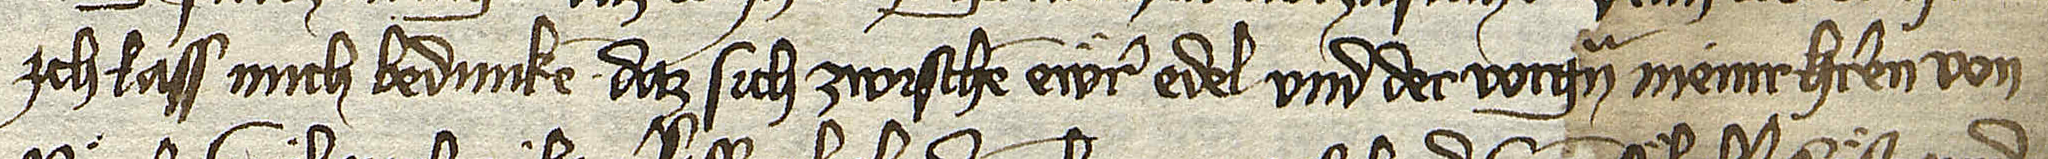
Ich laſſ mich bedunke* . daʒ ſich ʒwiſche* ew*r edel vnd der vorg*n meinr h*ren von
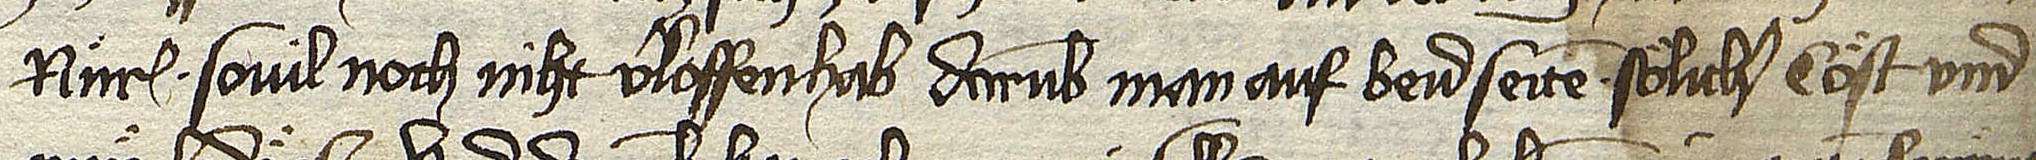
Nür* . ſouil noch niht v*loſſen hab Daru*b man auf beid ſeite* . ſölich* Cöſt vnd
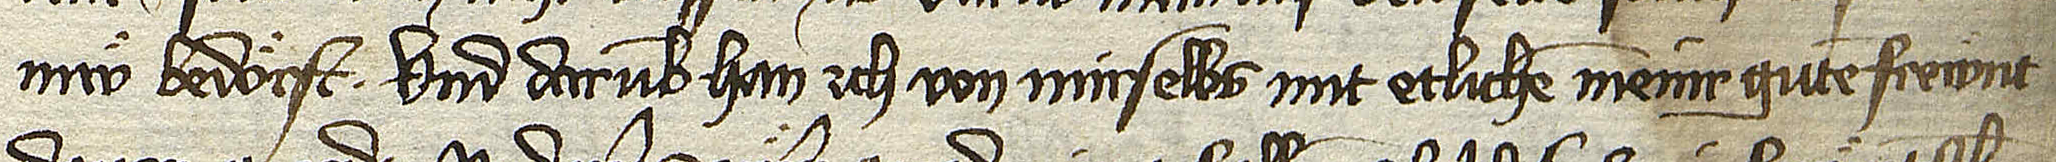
mw bedörft . Vnd daru*b han ich von mirſelbs mit etliche* meinr gute* frewnt
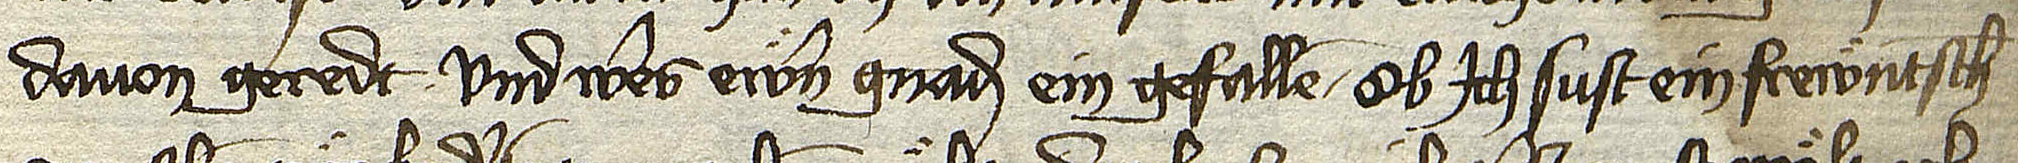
dauon geredt . Vnd we*s ew*n gnad* ein gefalle* / Ob Ich ſuſt ein frewntſch*
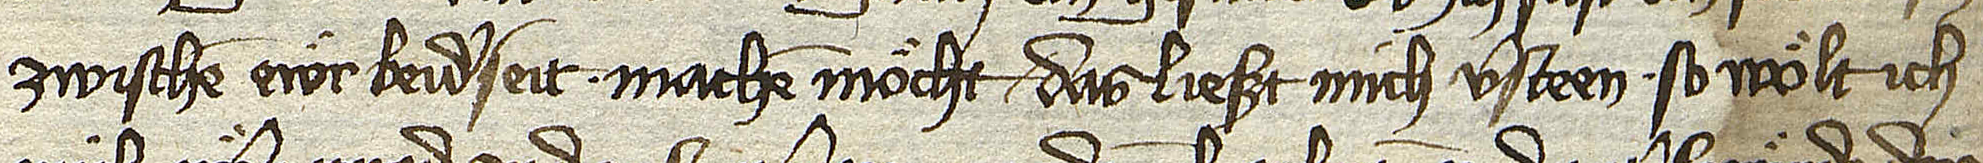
ʒwiſche* ewr beid*ſeit . mache* möcht / das lieſʒt mich v*ſteen . ſo wölt ich
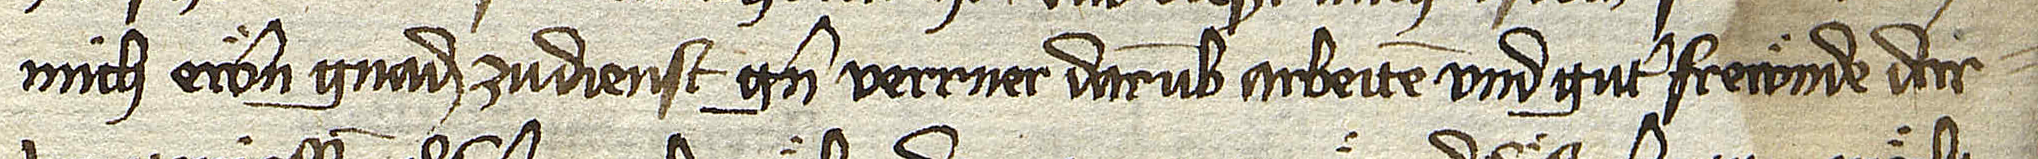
mich ew*n gnad* ʒudienſt g*n verrner daru*b arbeite* vnd gut* frewnde dar =
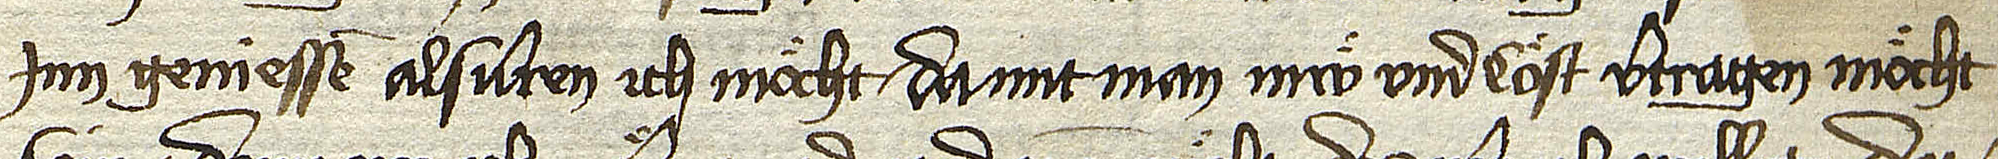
Inn genieſſe* alſu*ren ich möcht / damit man mw vnd Cöſt v*tragen möcht
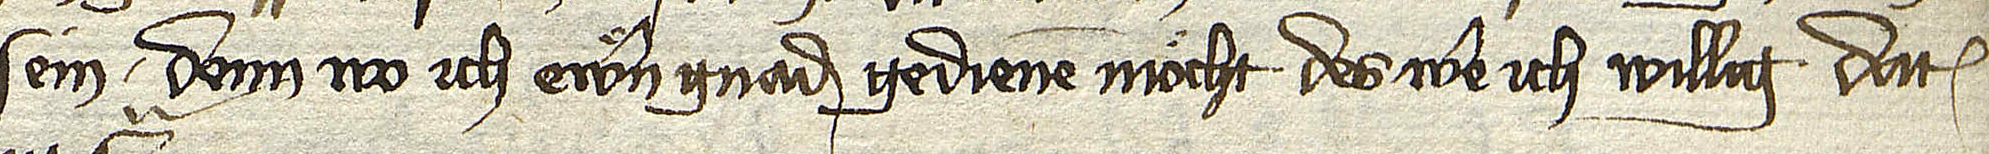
ſein / Denn wo ich ew*n gnad* gediene* möcht des we* ich willig . Dat*
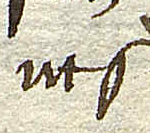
ut ſ*
